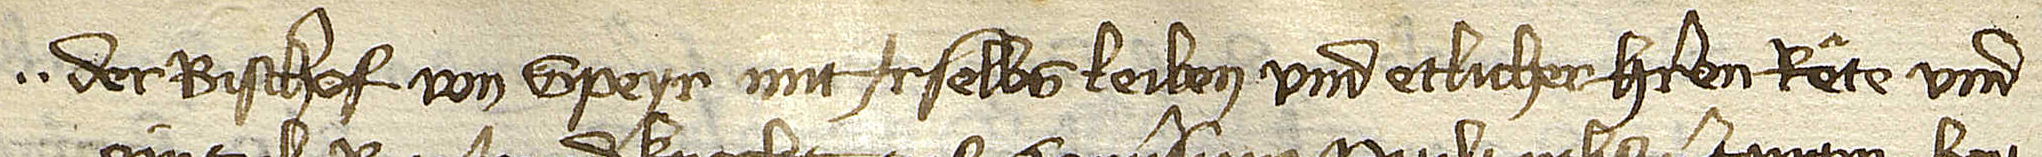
~ der Biſchof von Speyr mit Irſelbs leiben vnd etlicher h*ren Rëte vnd
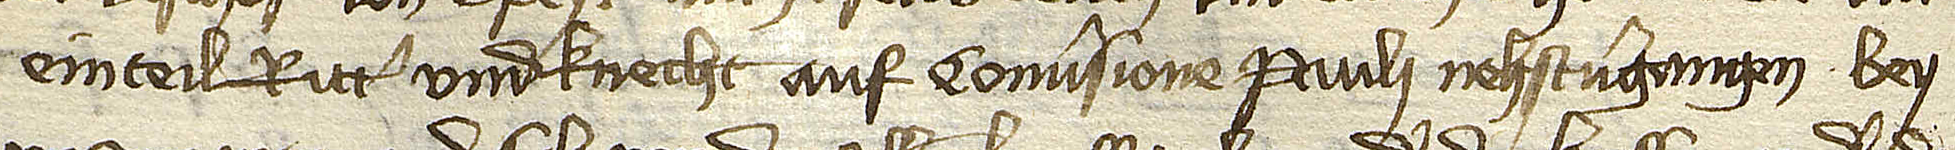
einteil Ritt* vnd knecht auf Conu*ſione Pauli nehſt u*gangen . bey
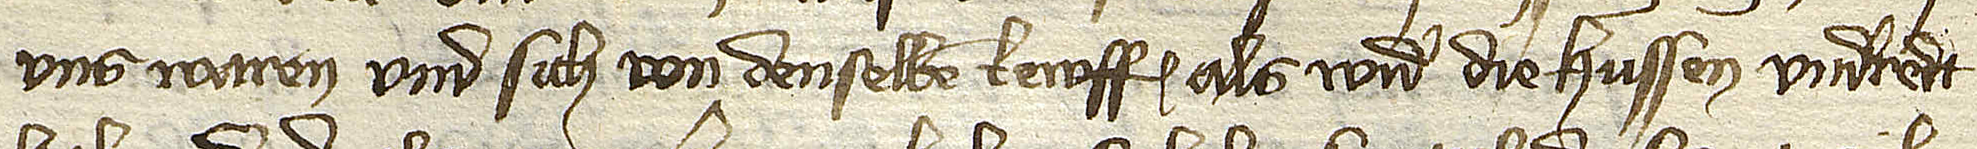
vns waren vnd ſich von denſelbe* lewff* als wid* die huſſen vnd*redt
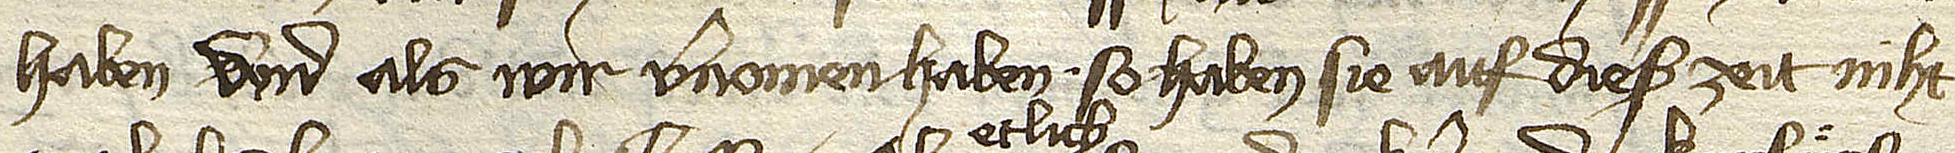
haben Vnd als wir v*nomen haben . ſo haben ſie auf dieſ* ʒeit niht
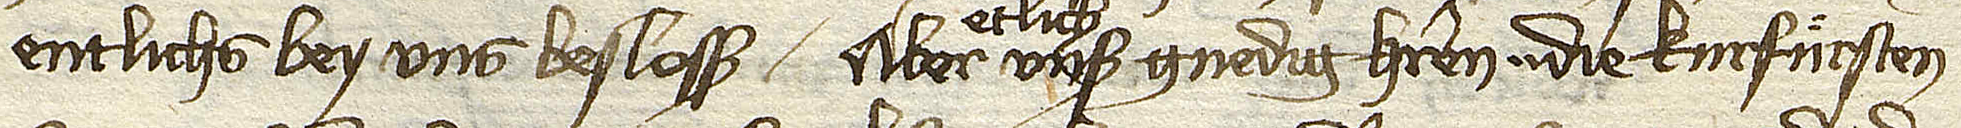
entlichs bey vns beſloſſ* / Aber vnſ* gnedig h*ren ~ die kurfürſten
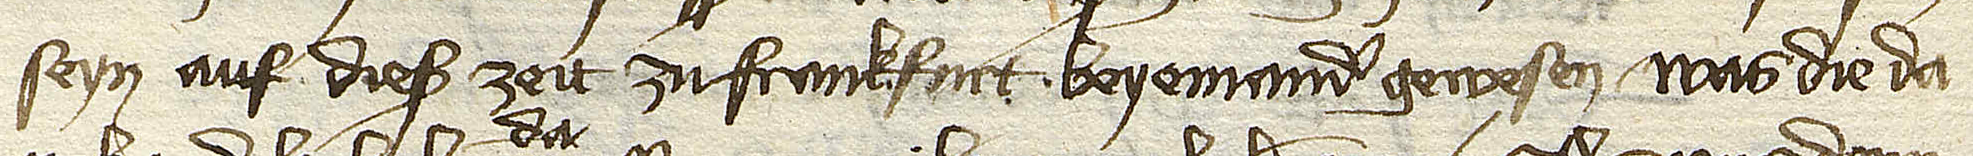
ſeyn auf dieſ* ʒeit ʒu frankfurt . beyeinand* geweſen / was die da
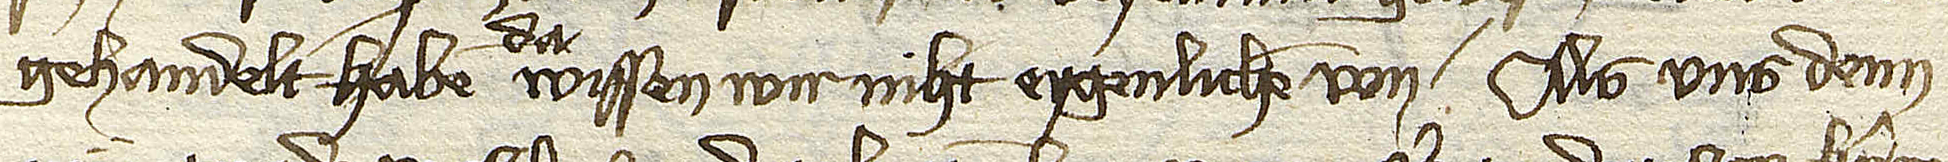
gehandelt habe* wiſſen wir niht eygenliche* von / Als vns denn
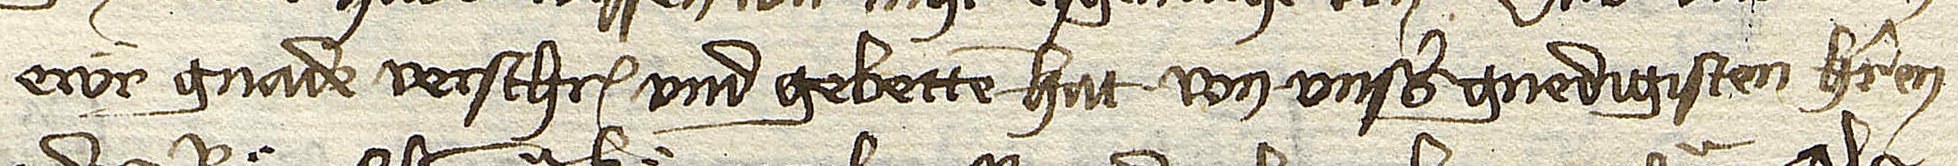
ewr gnade verſchr* vnd gebette* hat von vnſ*s gnedigiſten h*ren
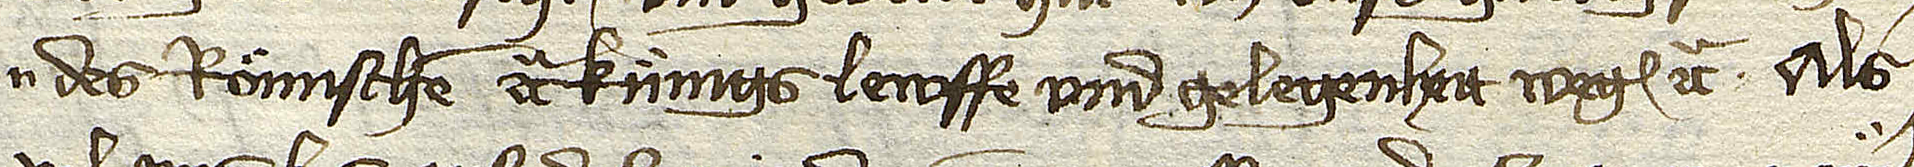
~ des Römiſche* ec* künigs lewffe vnd gelegenheit weg* ec* . Als
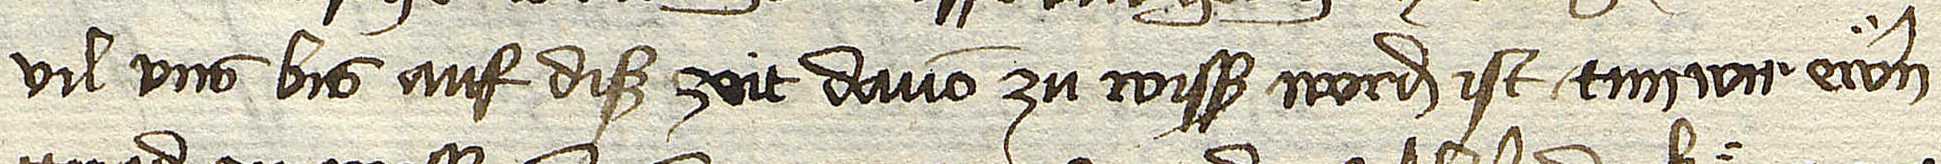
vil vns bis auf diſʒ ʒeit dauo* ʒu wiſſ* word* iſt / tun wir ew*n
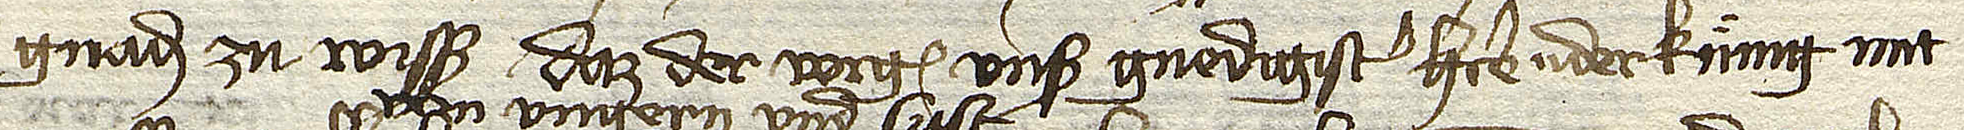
gnad* ʒu wiſſ* / daʒ der vorg* vnſ* gnedigiſt* h*re ~ der künig mit
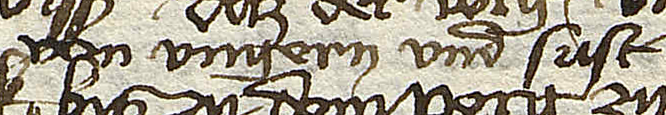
von vngern vnd ſuſt
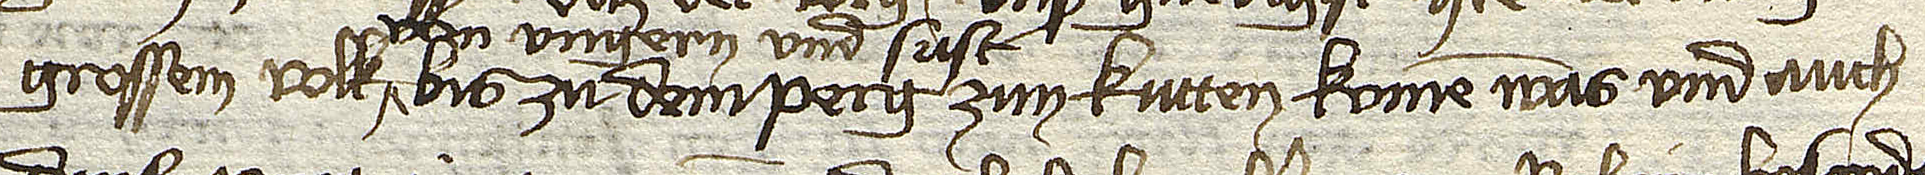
groſſem volk bis ʒu dem perg ʒum kutten kome* was vnd auch
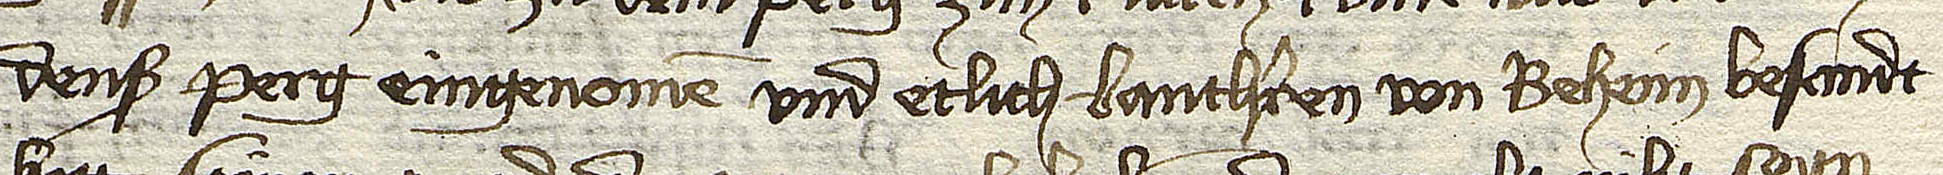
denſ* Perg eingenome* vnd etlich lanth*ren von Beheim beſandt
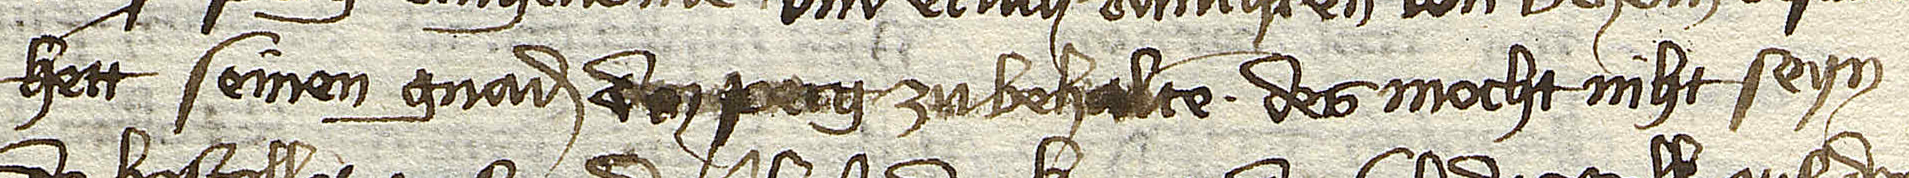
hett ſeinen gnad* den perg ʒu behalte* . des mocht niht ſeyn
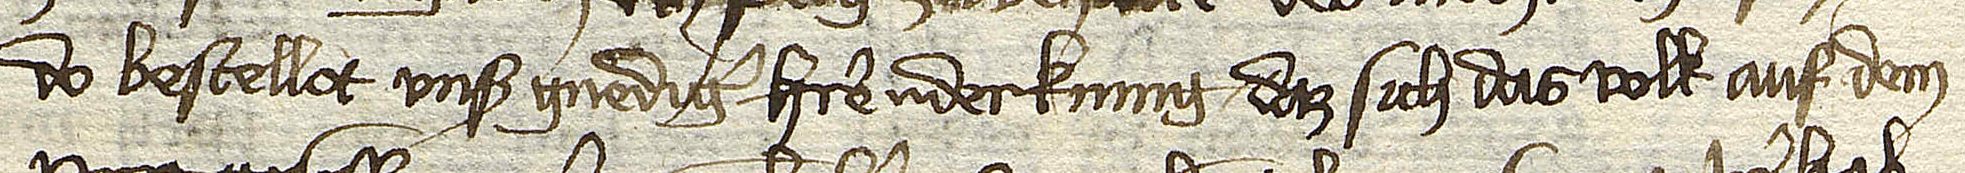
do beſtellot vnſ* gnedig* h*re ~ der kunig / daʒ ſich das volk auf dem
